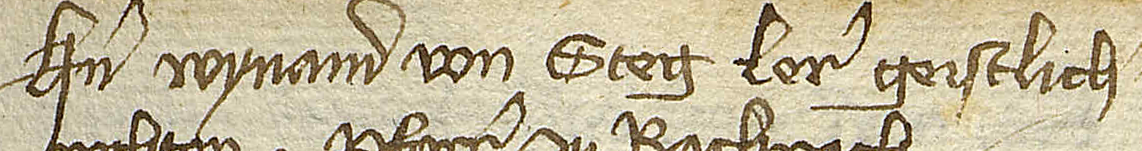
H*n wynand von Steg ler* geiſtlich*
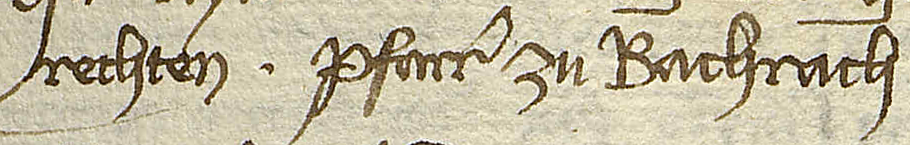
rechten . Pfarr* ʒu Bachrach
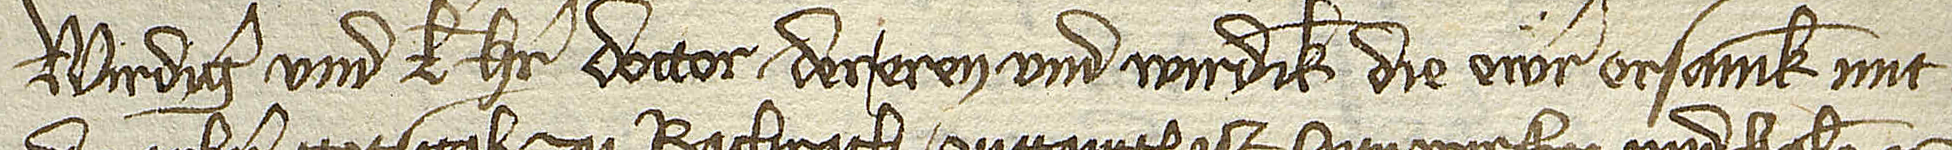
Wirdig* vnd L* H*r doctor / der eren vnd wirdik* die ew*r erſamk* mit
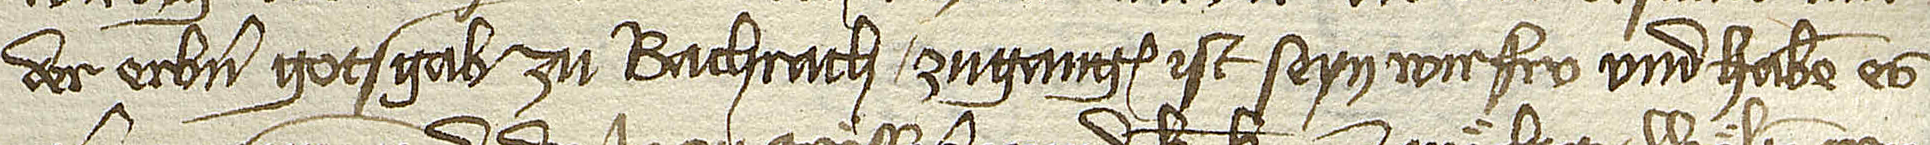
der erb*n gotſgab ʒu Bachrach ʒugang* iſt ſeyn wir fro vnd habe* es
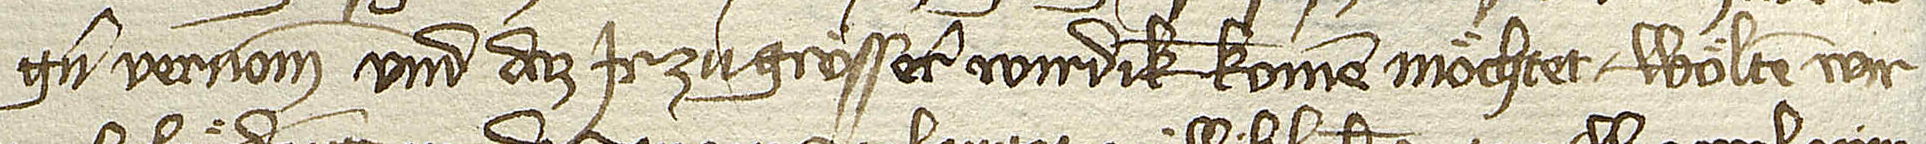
g*n vernom* vnd daʒ Ir ʒu gröſſer* wirdik* kome* möchtet / Wölte* wir
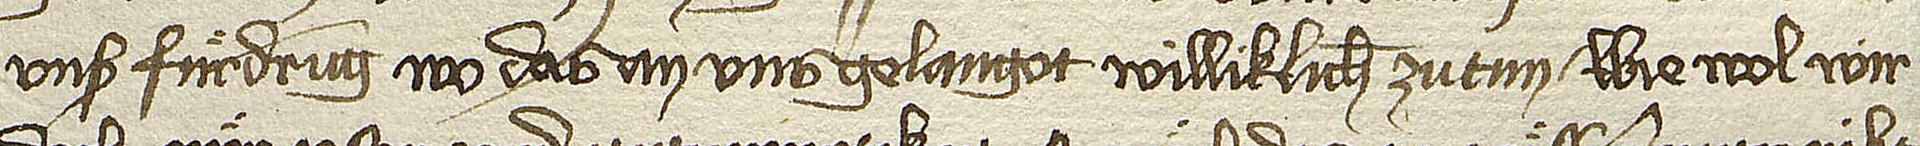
vnſ* fürdru*g wo das an vns gelanget williklich* ʒu tun / Wie wol wir
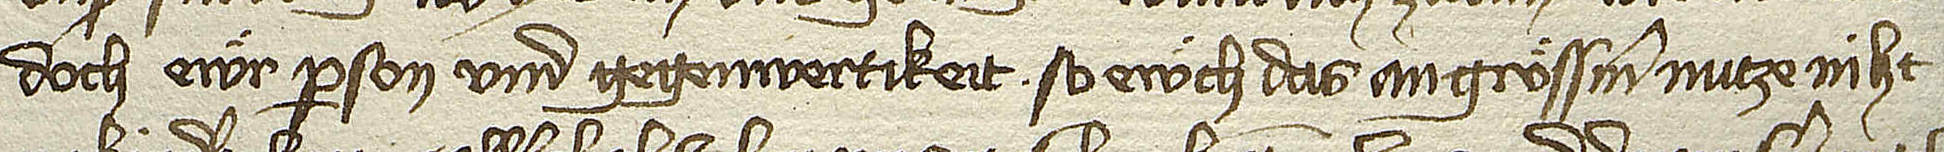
doch ewr p*ſon vnd gegenwertikeit . ſo ewch das an gröſſ*m nucʒe niht
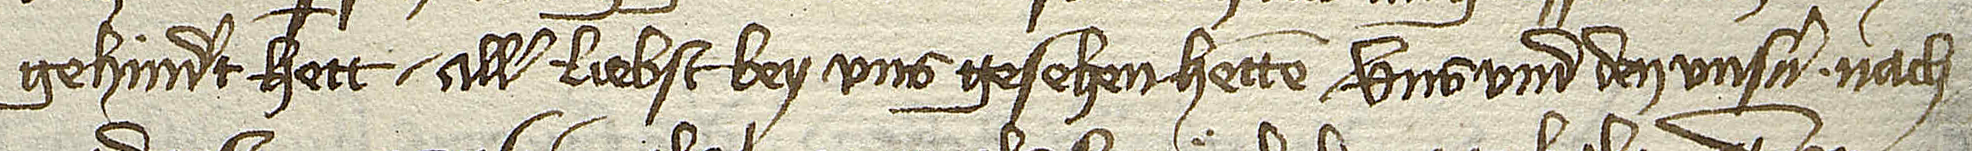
gehind*t hett / all* liebſt bey vns geſehen hette* / Vns vnd den vnſ*n . nach
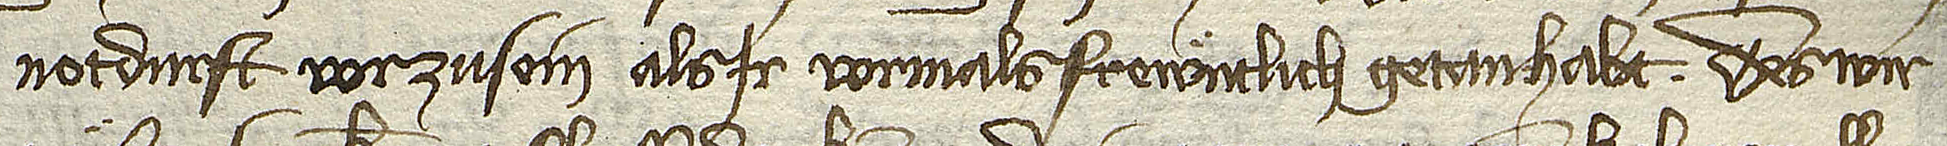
notdurft vorʒuſein als Ir vormals frewntlich getan habt . Des wir
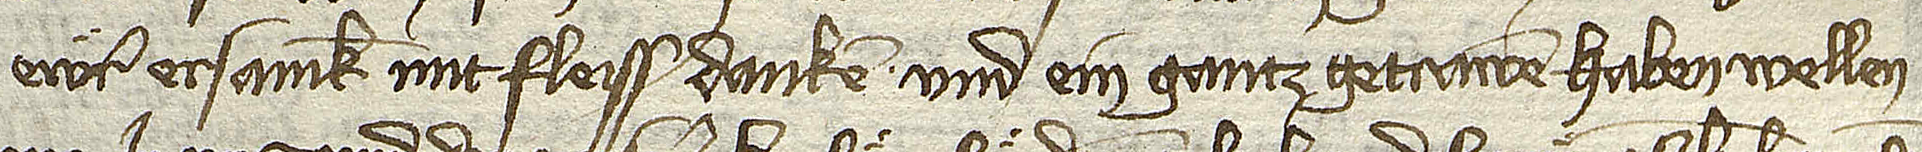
ew*r erſamk* mit fleiſſ danke* . vnd ein gancʒ getrawe* haben wellen
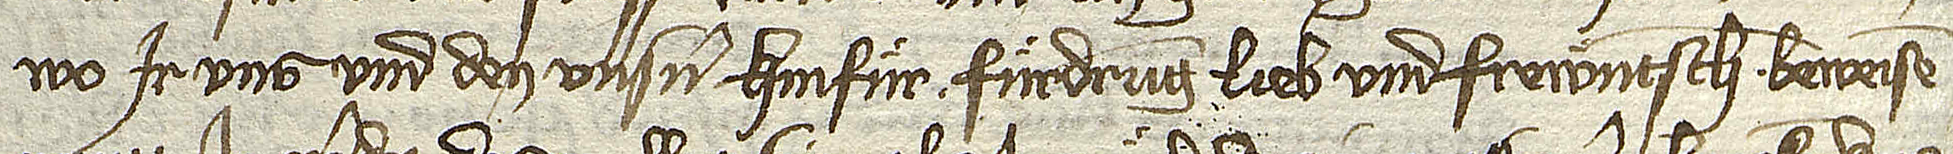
wo Ir vns vnd den vnſ*n hinfür . fürdru*g lieb vnd frewntſch* . beweiſe*
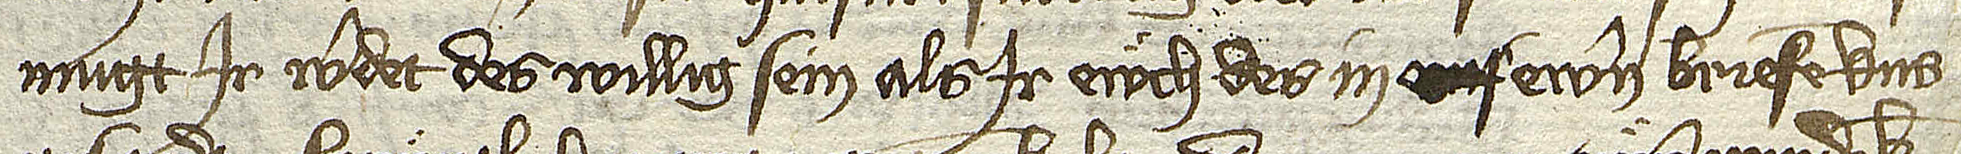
mugt Ir w*det des willig ſein als Ir ewch des in vnſ ew*n briefe* vns
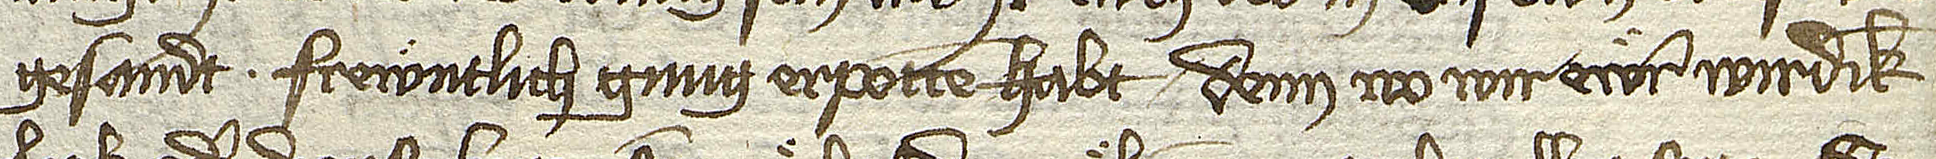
geſandt . frewntlich gnug erpotte* habt / Denn wo wir ewr* wirdik*
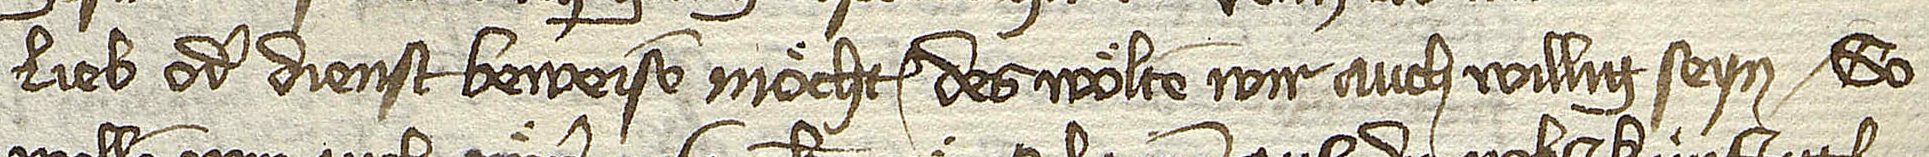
lieb od* dienſt beweiſe* möcht* Des wölte* wir auch willig ſeyn / So
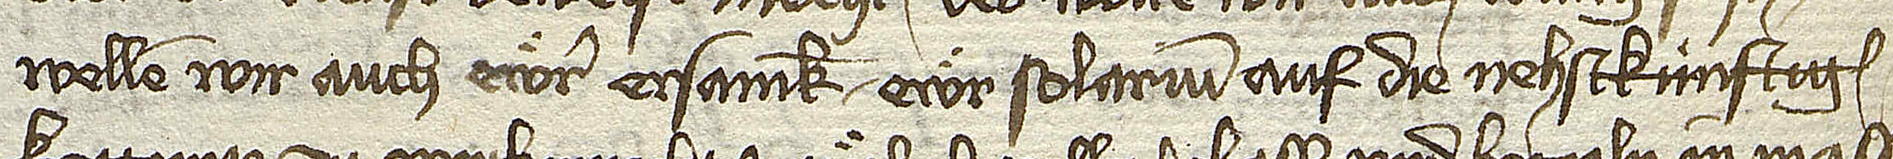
welle* wir auch ewr* erſamk* / ewr ſolariu* auf die nehſtkünftig*
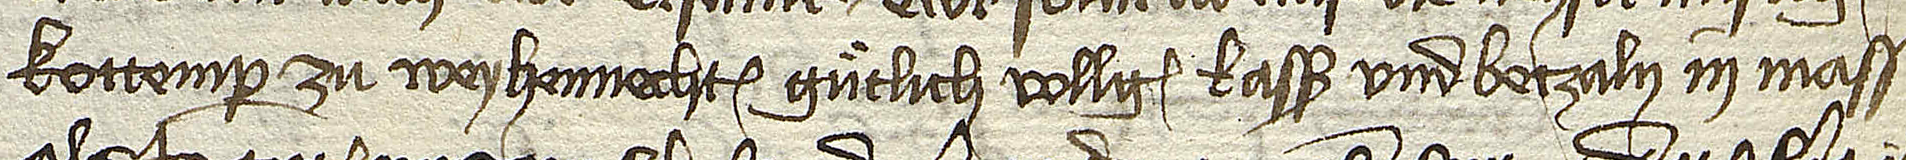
kottemp* ʒu weyhennecht* gütlich vollg* laſſ* vnd becʒaln in maſſ
